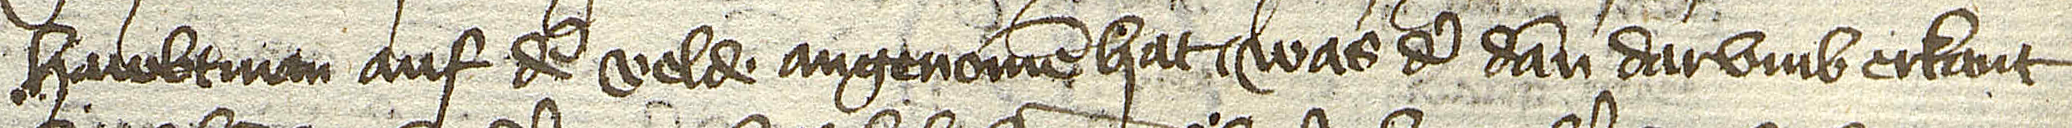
hawbtman auf d* velde angenome* hat / was d* dan* darvmb erkant
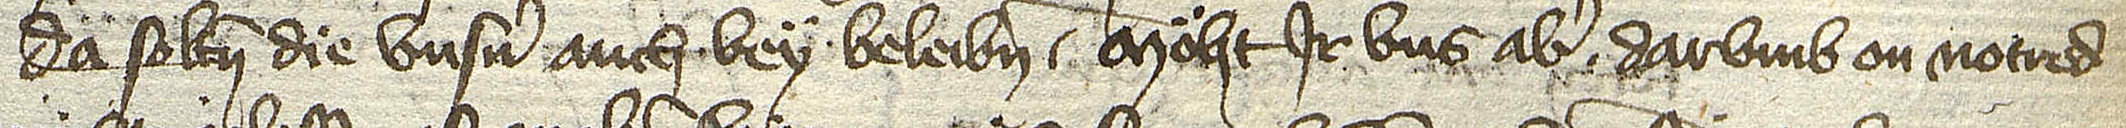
da ſoltn* die vnſn* auch bey beleibn* / Möht Ir vns ab* . darvmb on notred
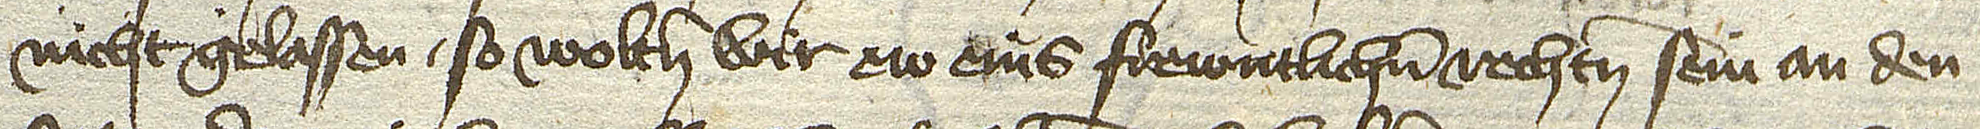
nicht gelaſſen / ſo woltn* Wir ew eins frewntlichn* rechtn* ſein an den
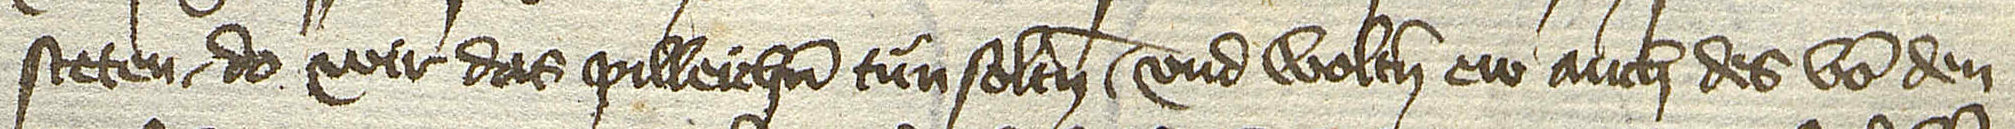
ſteten / do wir das pilleichn* tün ſoltn* / vnd woltn* ew auch des vo* den
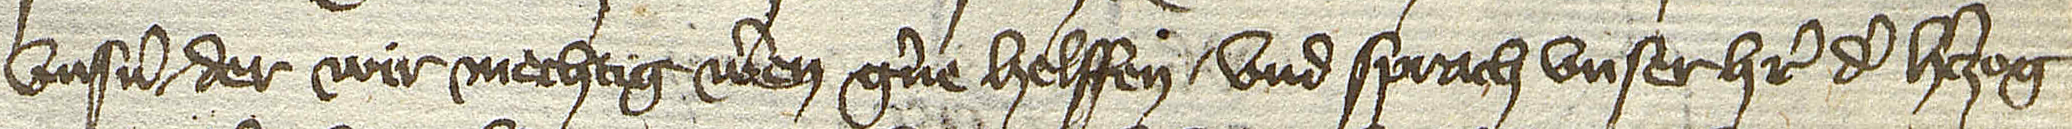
vnſn* / der wir mechtig w*en g*ne helffen / vnd ſprach vnſer hr* d* h*cʒog
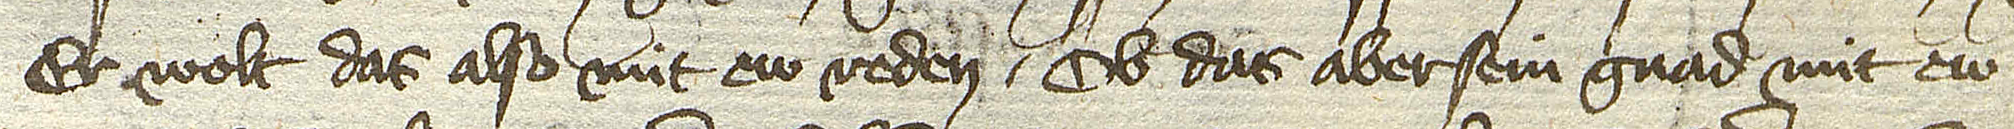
Er wolt das alſo mit ew reden / Ob das aber ſein gnad mit ew
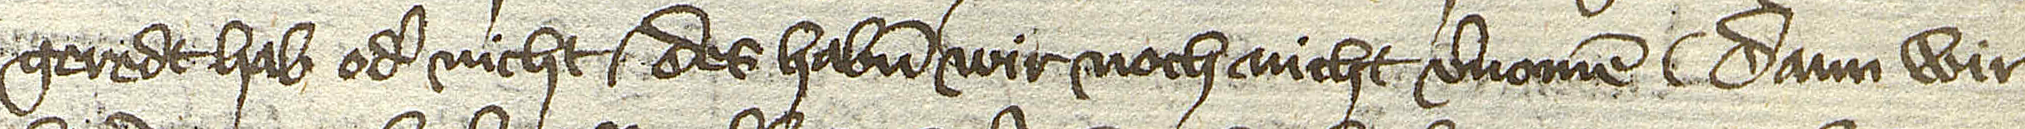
geredt hab od* nicht / Des habn* wir noch nicht v*nome* / Dann wir
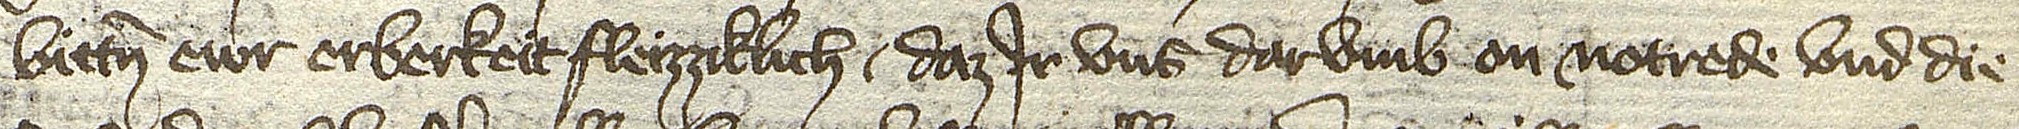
bittn* ewr erberkeit fleiʒʒiklich / daʒ Ir vns darvmb on notrede vnd die
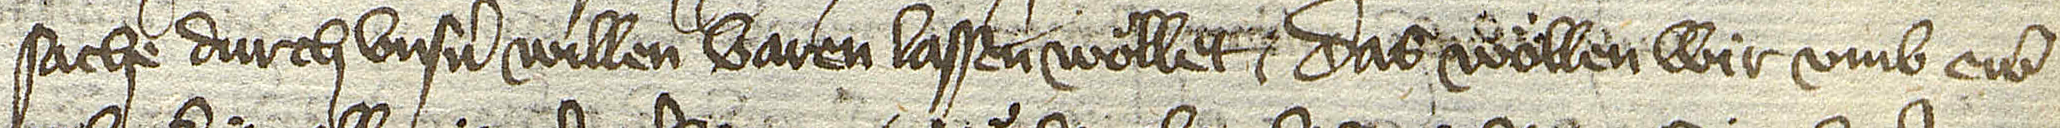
ſache durch vnſn* willen varen laſſen wöllet / Das wöllen wir vmb ew*
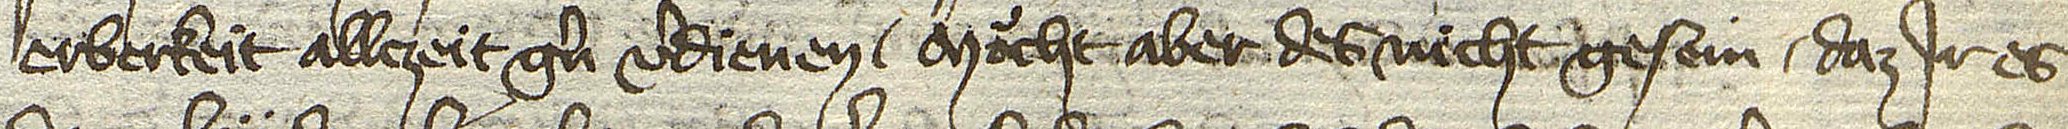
erberkeit allcʒeit gn* v*dienen / Möcht aber des nicht geſein / daʒ Ir es
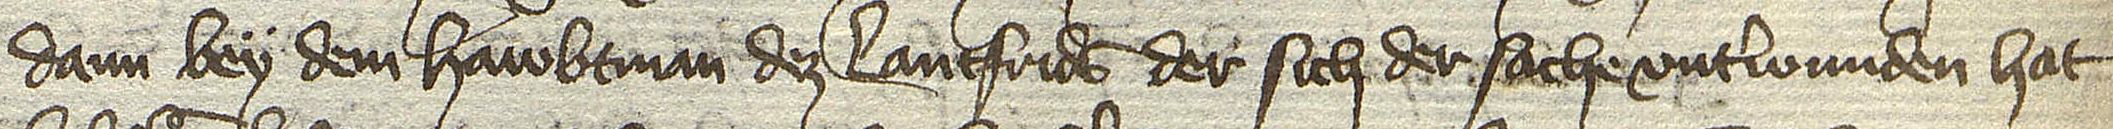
dann bey dem hawbtman deʒ Lantfrids der ſich der ſache vnt*wunden hat
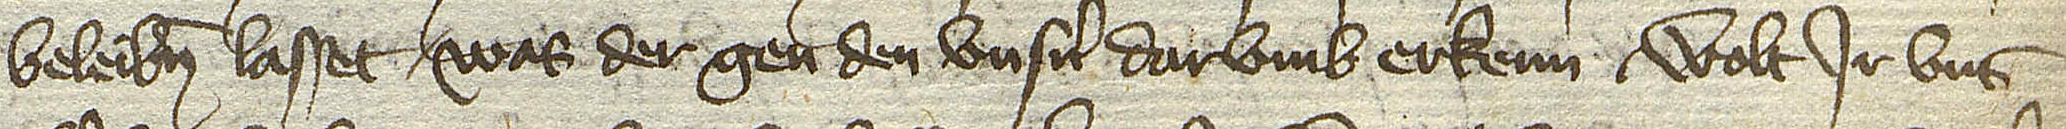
beleibn* laſſet / was der gen den vnſn* darvmb erkenn / Wolt Ir vns
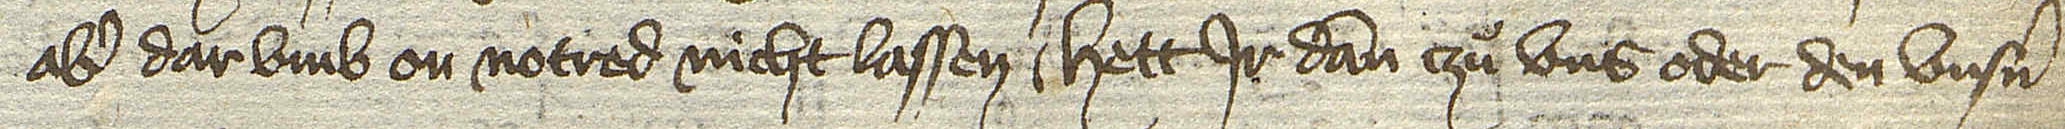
ab* dar vmb on notred nicht laſſen / hett Ir dan* cʒü vns oder den vnſn*
